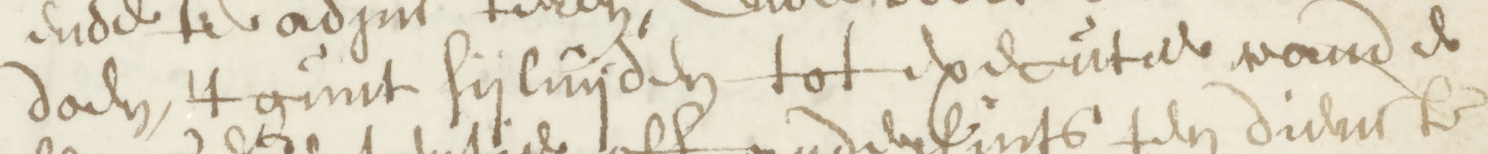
doen, 't gunt sij luijden tot executie vande
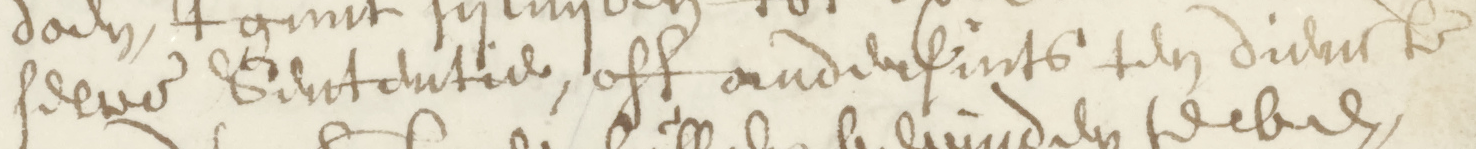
selve Sententie, oft andersints ten dienste
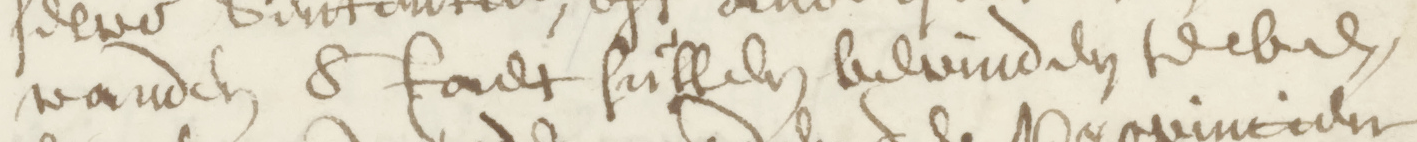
vanden Staet sullen bevinden te be„
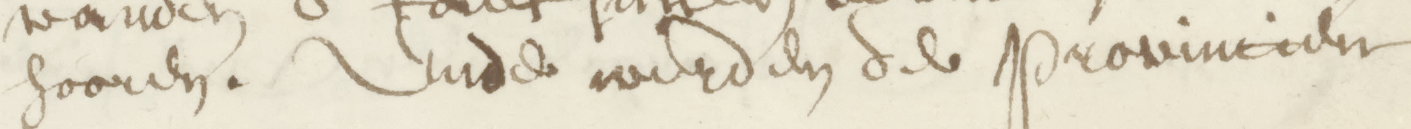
hooren. Ende werden de Provincien
